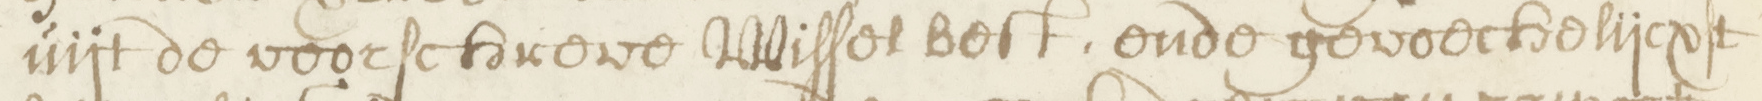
uijt de voorschreve Wissel best, ende gevoechelijcxst
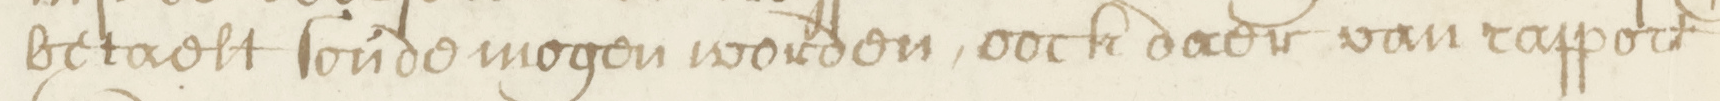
betaelt soude mogen worden, oock daer van rapport
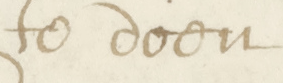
te doen
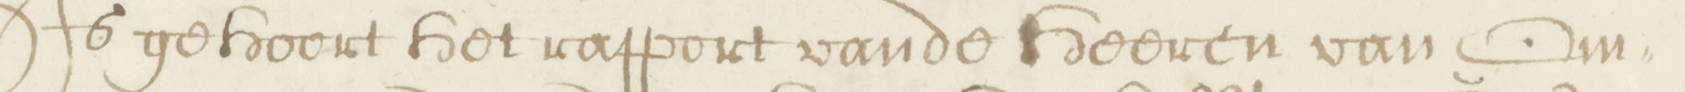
Is gehoort het rapport vande heeren van Om,,
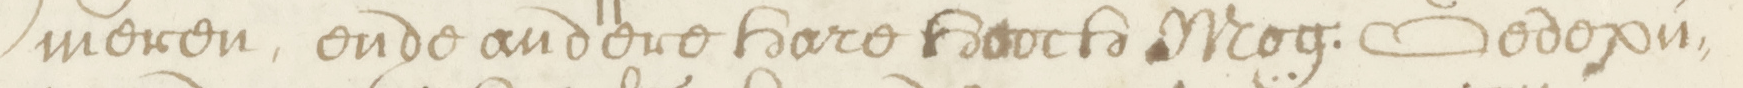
meren, ende andere hare hooch Mog: Gedepu,,
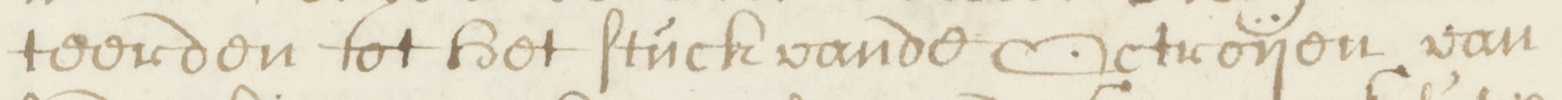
teerden tot het stuck vande Octroijen van
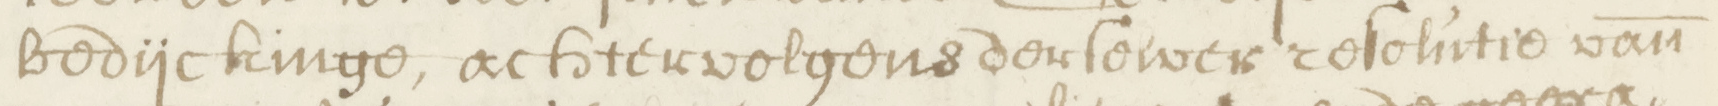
bedijckinge, achtervolgens derselver resolutie van
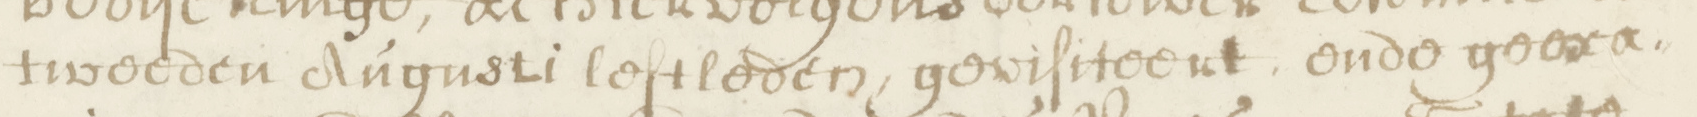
tweeden Augusti lestleden, gevisiteert, ende geexa„,
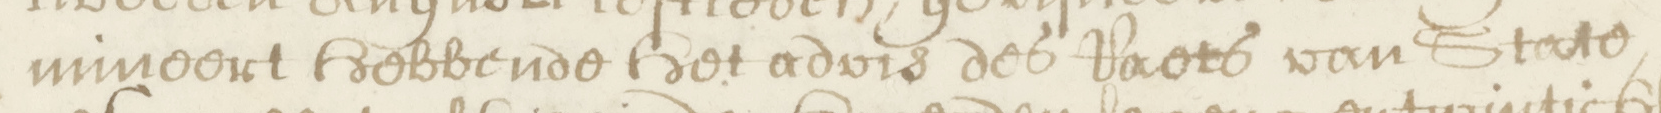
mineert hebbende het advis des Raets van State
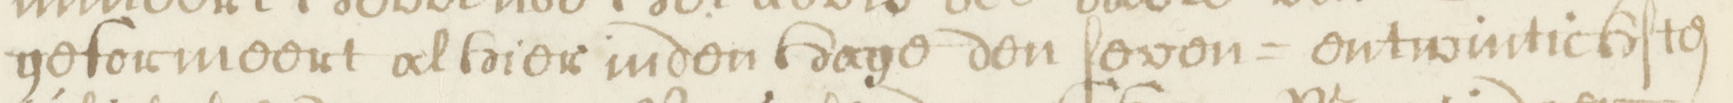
geformeert alhier inden hage den seven=entwintichsten
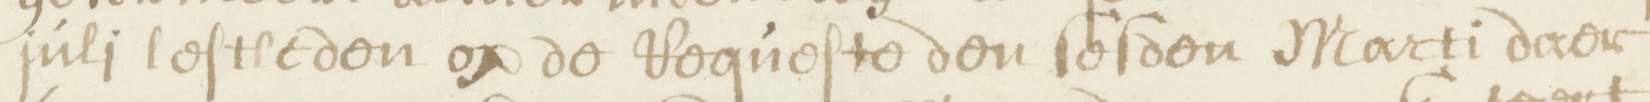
juli lestleden op de Requeste den sesden Marti daer
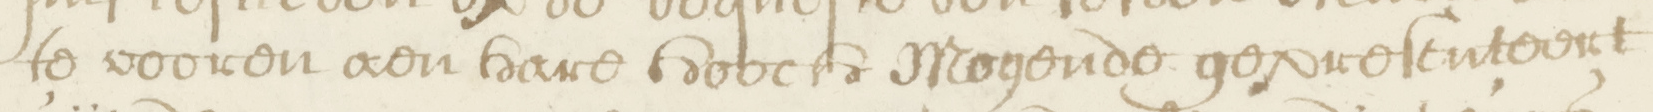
te vooren aen hare hooch Mogende gepresenteert
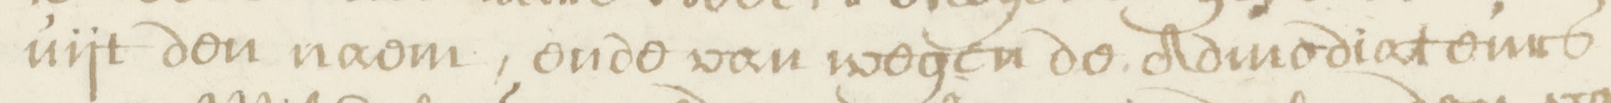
uijt den naem, ende van wegen de Admodiateurs
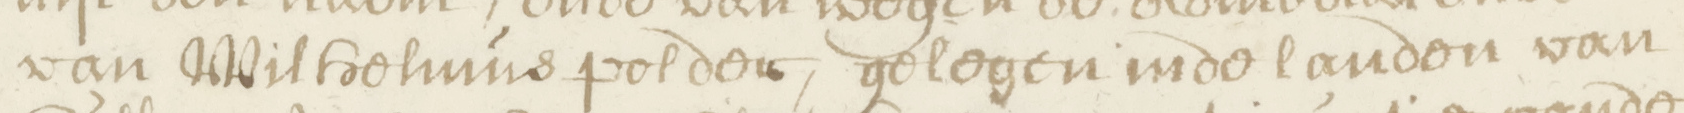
van Wilhelmus polder gelegen inde landen van
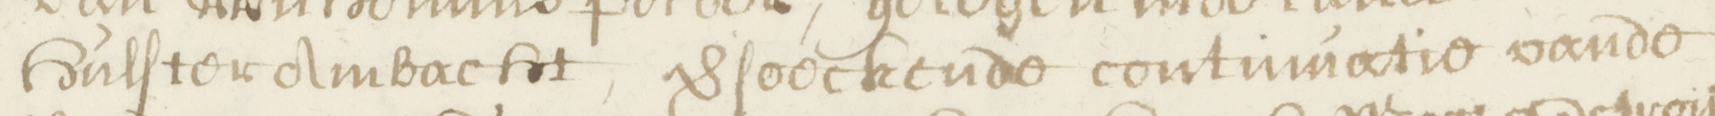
Hulster Ambacht, vsoeckende continuatie vande
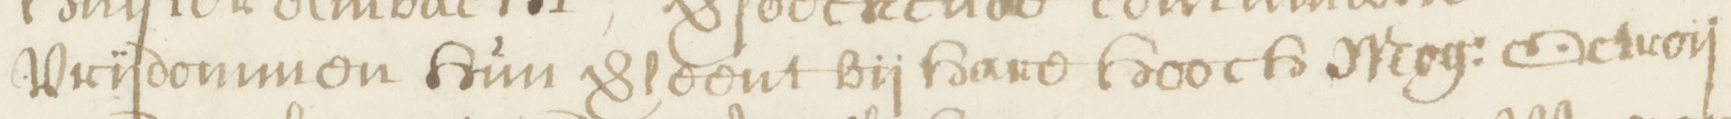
Vrijdommen hun vleent bij hare hooch Mog: Octroij
